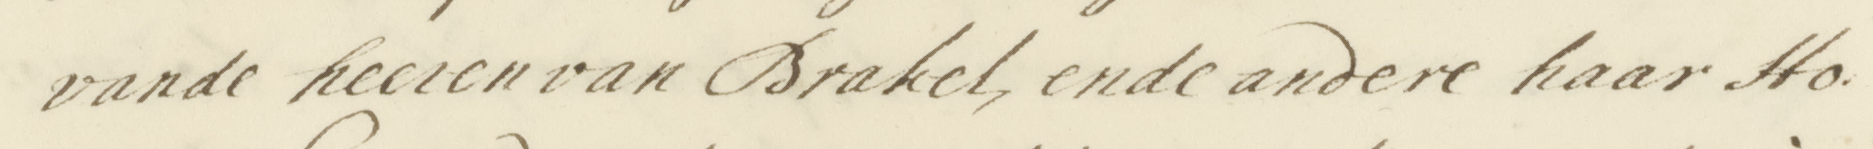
vande heeren van Brakel, ende andere haar Ho.
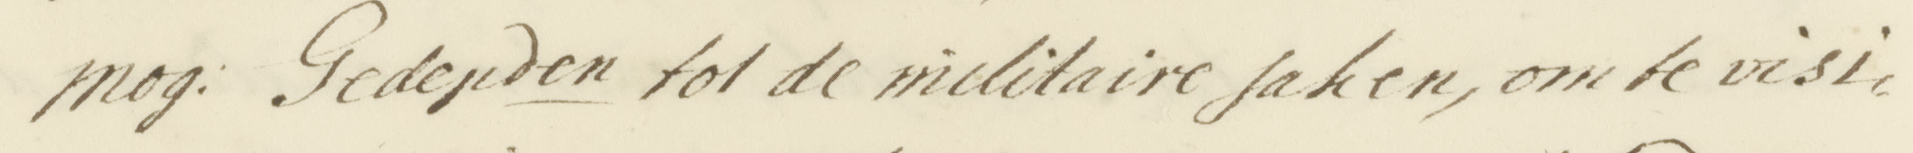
mog: Gedepden tot de militaire saken, om te visi„
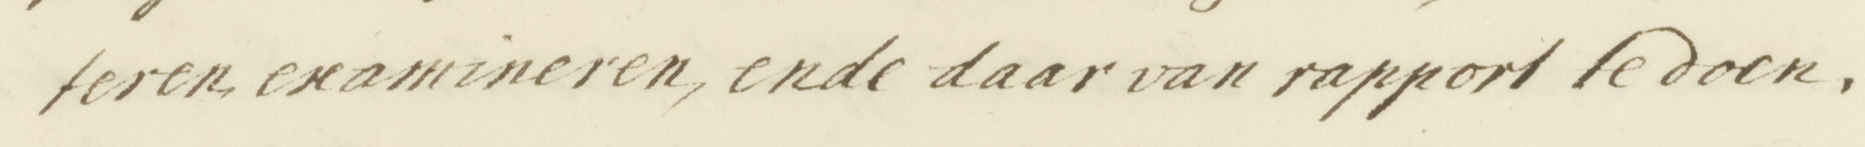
teren, examineren, ende daar van rapport te doen.
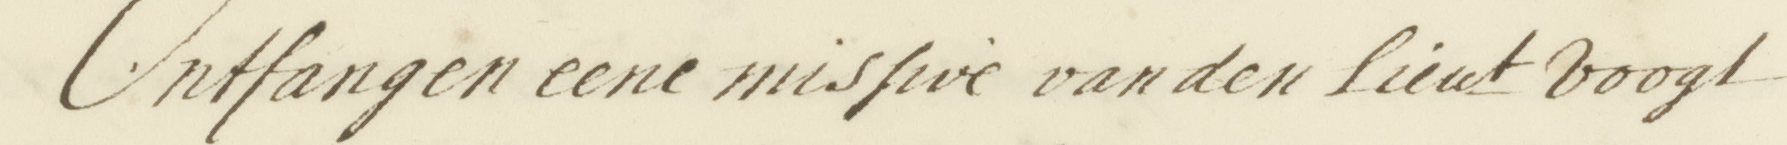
Ontfangen eene missive van den lieut voogt
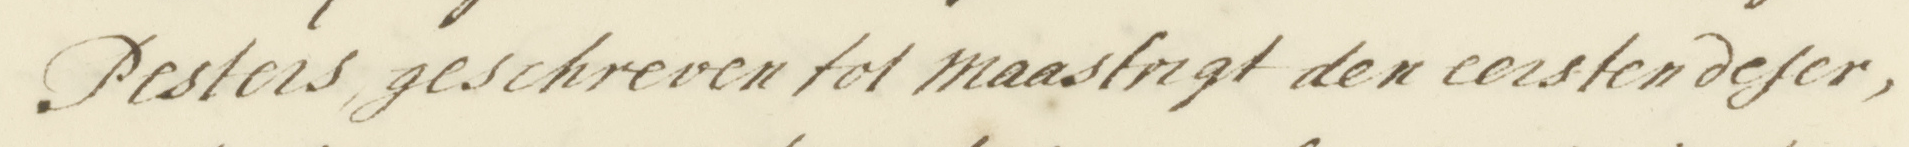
Pesters, geschreven tot maastrigt den eersten deser,
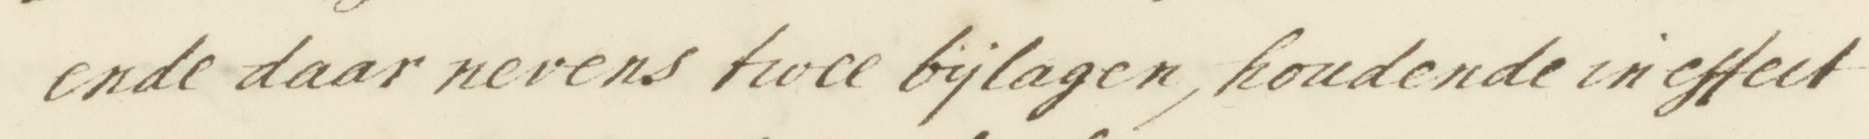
ende daar nevens twee bijlagen, houdende in effect
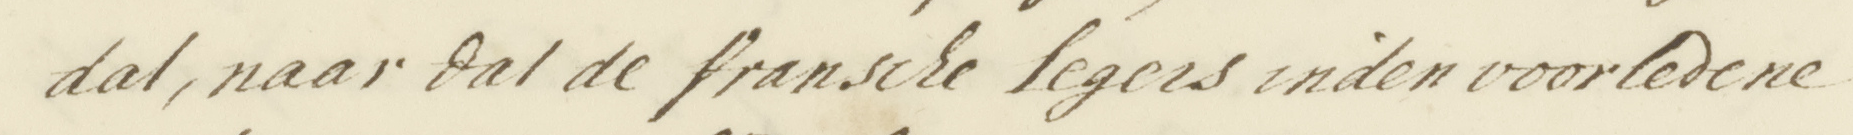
dat, naar dat de fransche legers inden voorledene
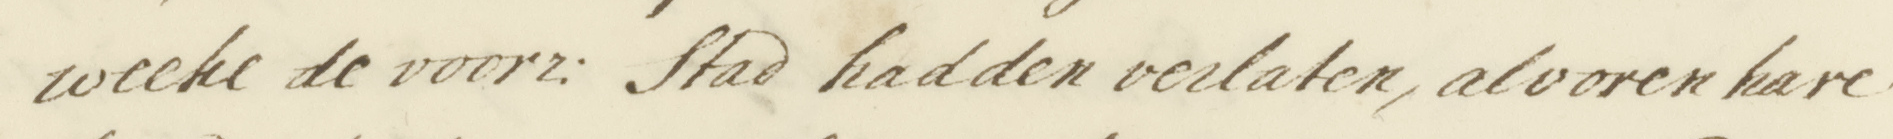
weeke de voorz: Stad hadden verlaten, alvoren hare
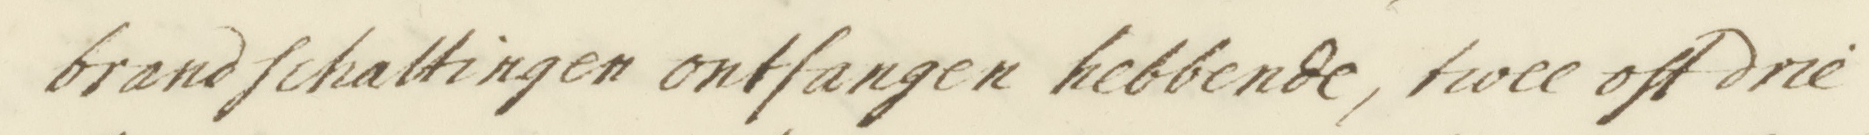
brand schattingen ontfangen hebbende, twee off drie
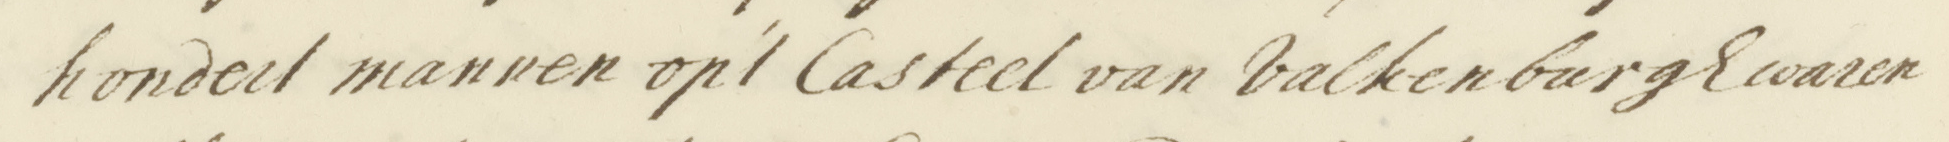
hondert mannen op ’t Casteel van valkenburgh waren
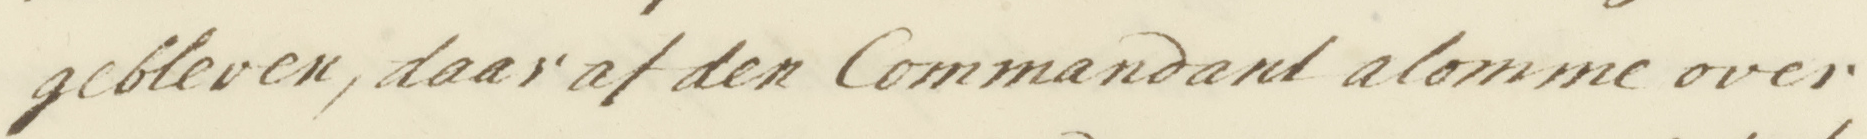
gebleven, daar af den Commandant alomme over
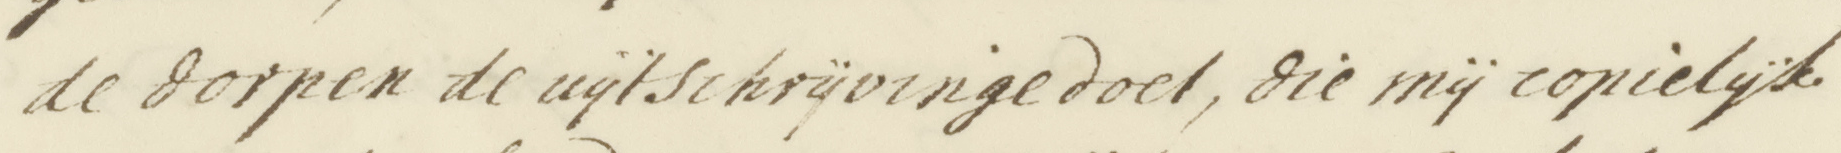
de dorpen de uijtschrijvinge doet, die mij copielijk
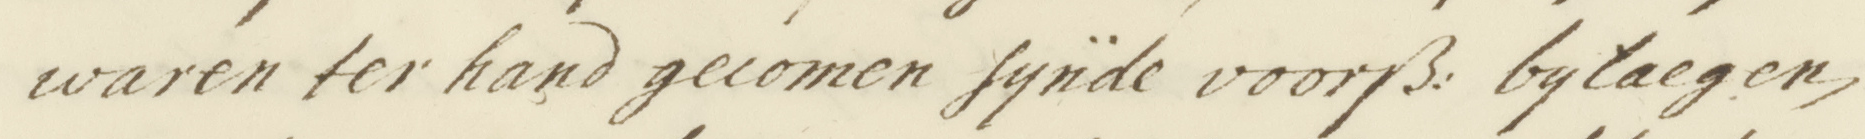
waren ter hand gecomen sijnde voors: bylaegen,
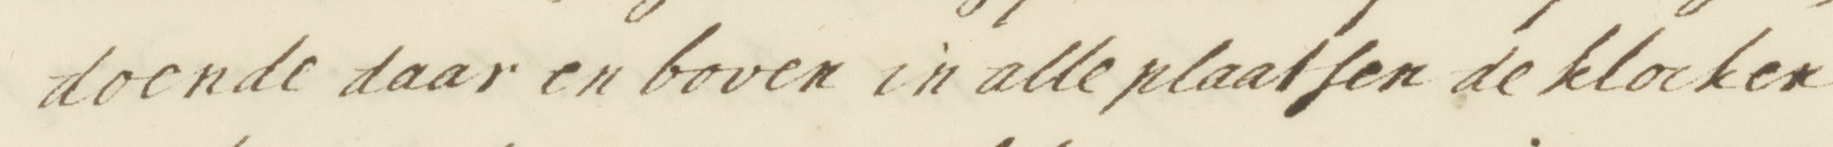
doende daar en boven in alle plaatsen de klocken
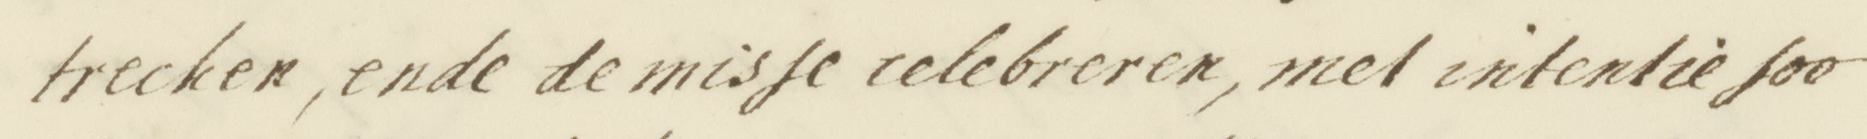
trecken, ende de misse celebreren, met intentie soo
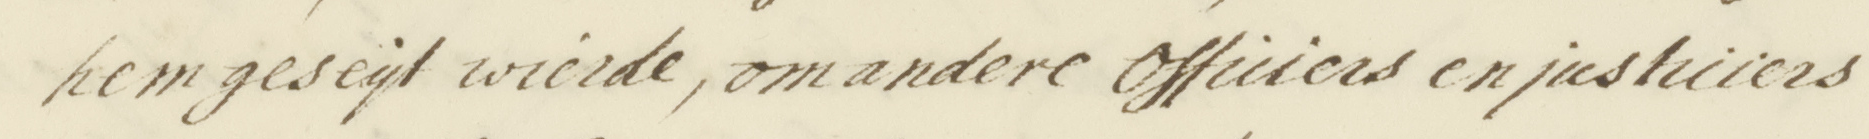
hem geseijt wierde, om andere officiers en justiciers
